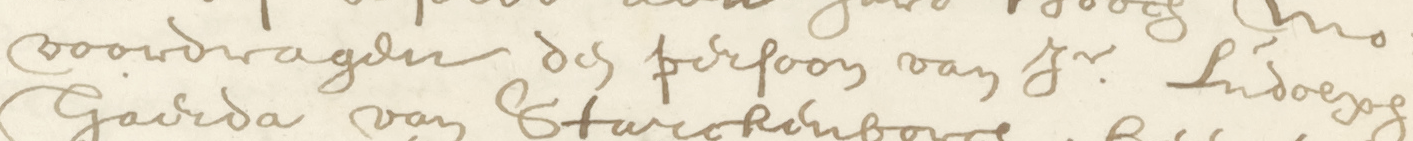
voordragen den persoon van Jr. Ludolph
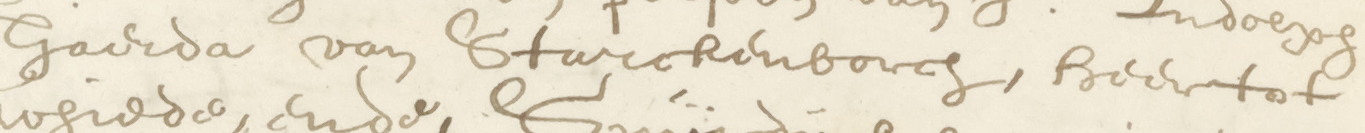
Tjaerda van Starckenborch, Heer tot
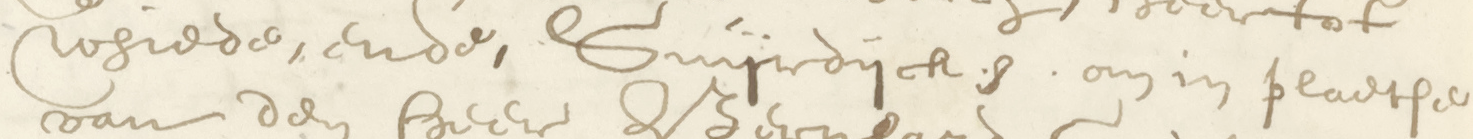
Whiede, ende, Suijrdijck & om in plaetse
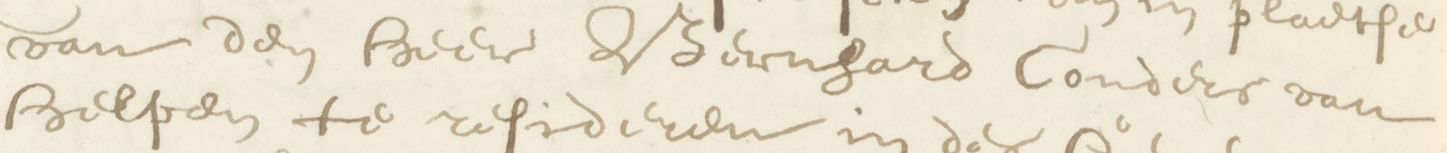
van den Heer Bernhard Conders van
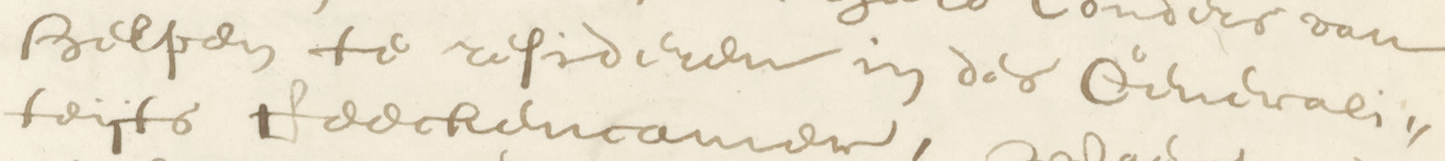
Helpen te resideren in des Generali„
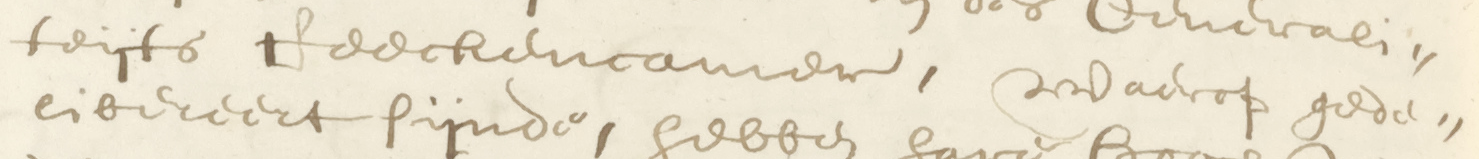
teijts Reeckencamer. Waerop gede„
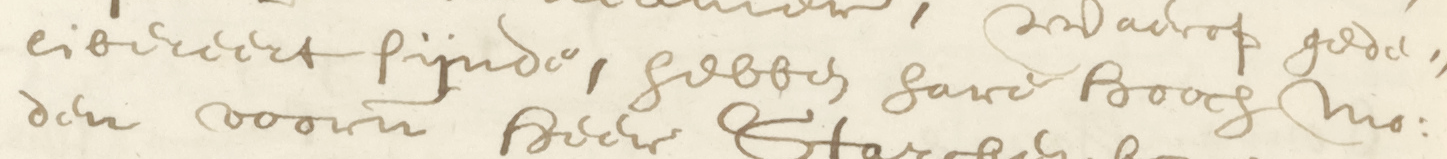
libereert sijnde, hebben hare hooch Mo:
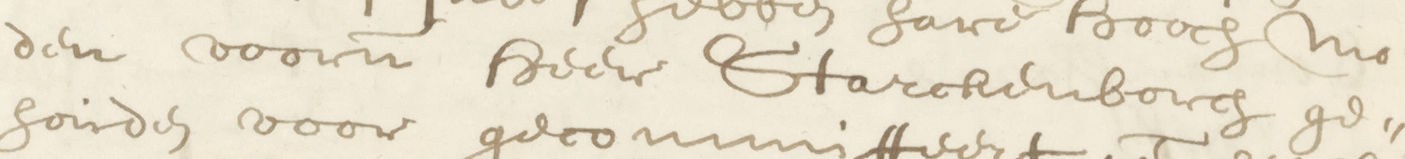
den voorn Heer Starckenborch ge„
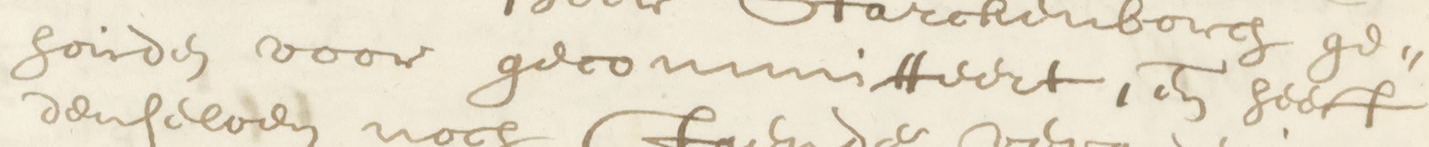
houden voor gecommitteert, en heeft
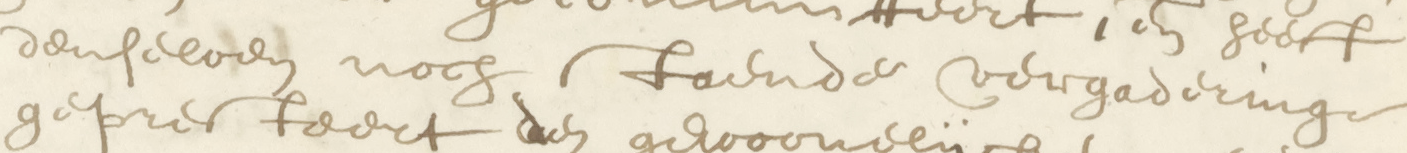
denselven noch staende vergaderinge
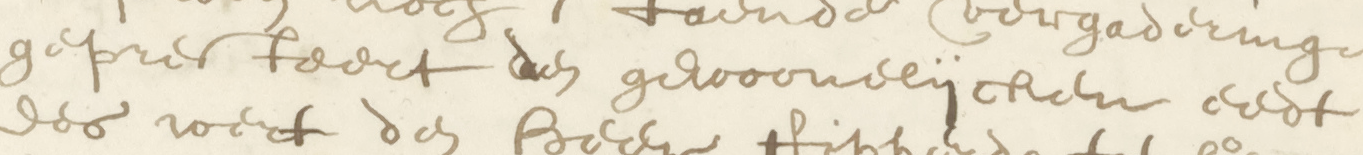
gepresteert den gewoonelijcken eedt.
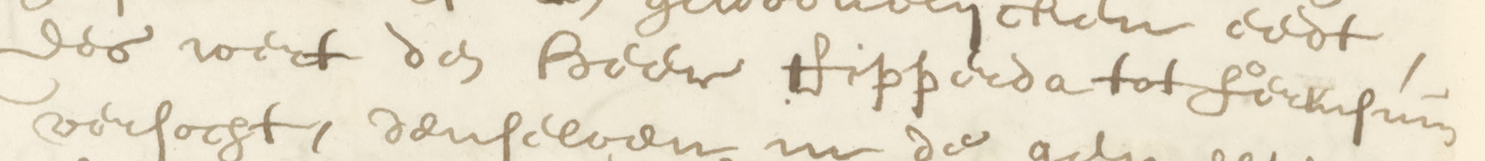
Des wert den Heer Ripperda tot fermsum
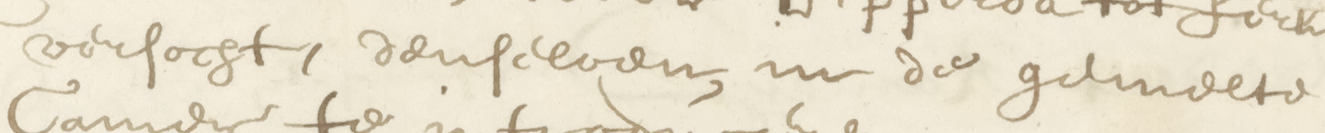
versocht, denselven in de gemelte
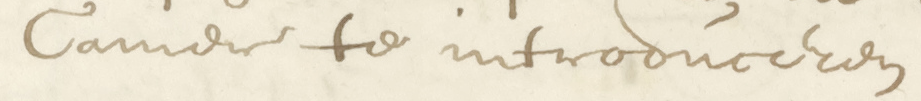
Camer te introduceren
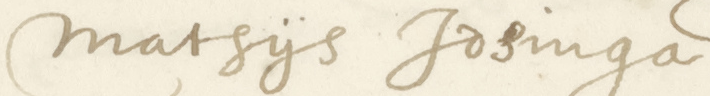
mathijs Idsinga
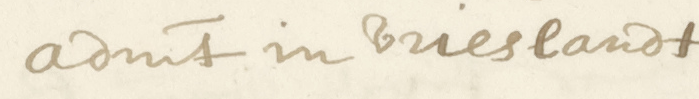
admt in Vrieslandt
